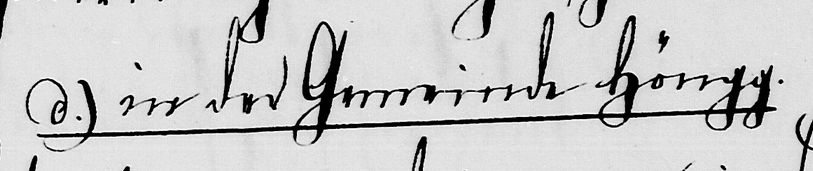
d.) in der Gemeinde Höngg.
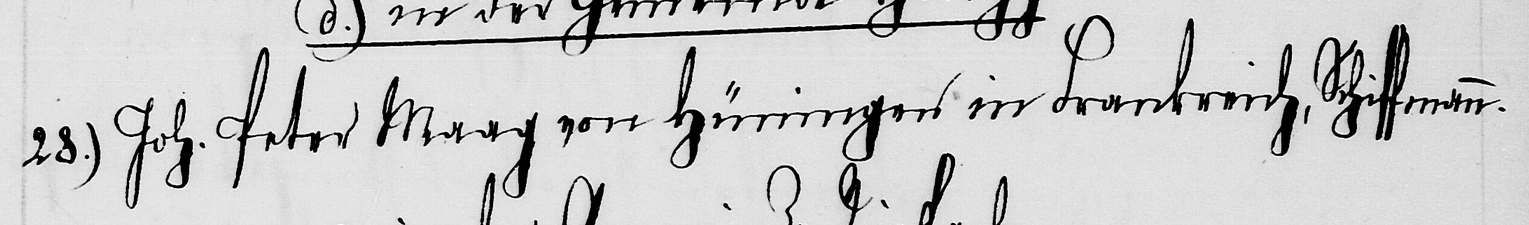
28.) Joh. Peter Maag von Hüningen in Frankreich, Schiffman¬
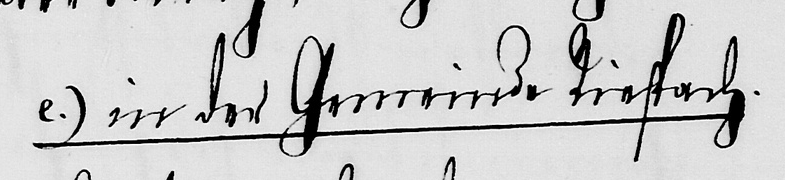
e.) in der Gemeinde Riespach.
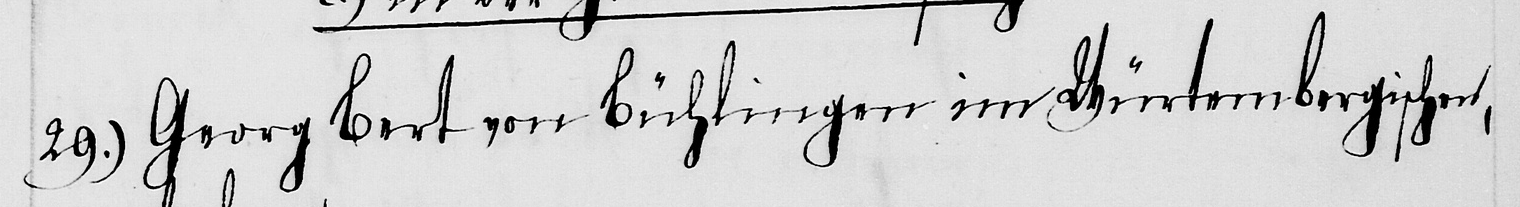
29.) Georg Bert von Büchlingen im Würtembergischen,
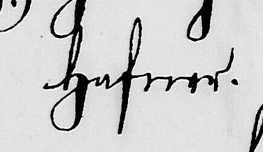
Hafner.
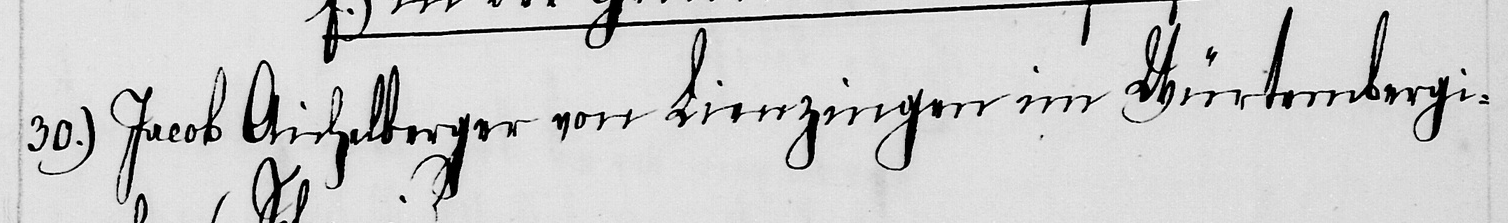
30.) Jacob Aichelberger von Lienzingen im Würtembergi¬
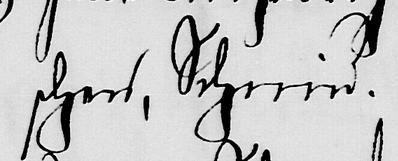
schen, Schmid.
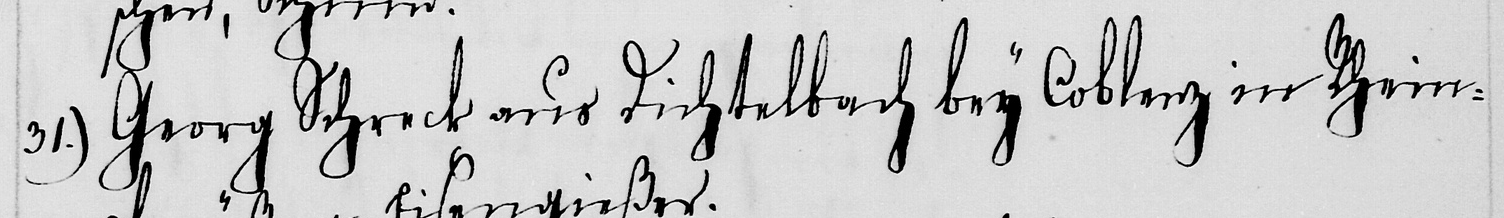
31.) Georg Schreck aus Dichtelbach bey Coblenz in Rhei¬
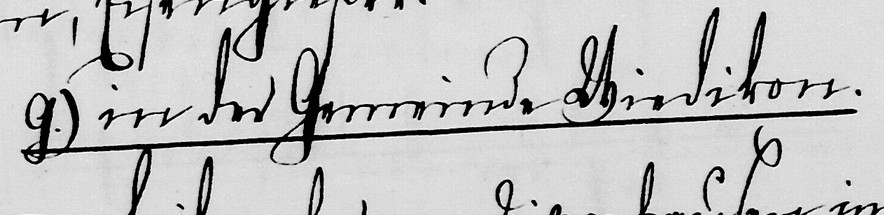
g.) in der Gemeinde Wiedikon.
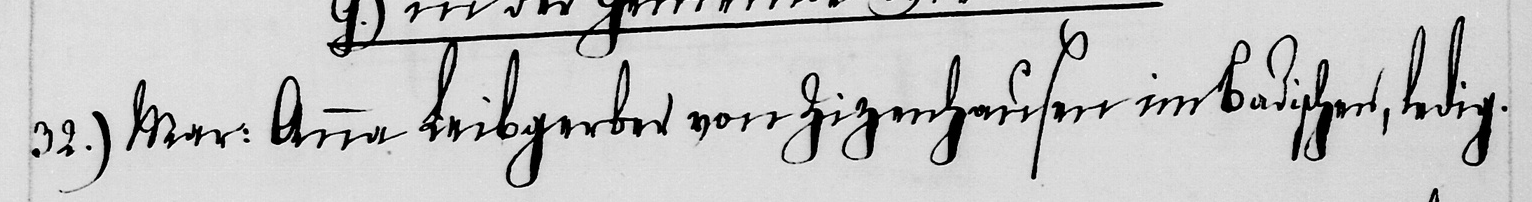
32.) Mar: Anna Leibgerber von Zizenhausen im Badischen, ledig.
